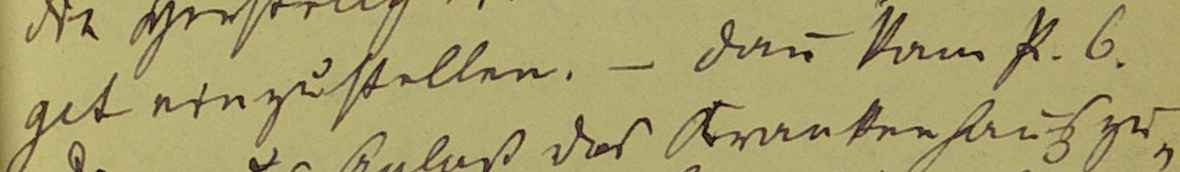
get einzustellen.- Dann kam P.6
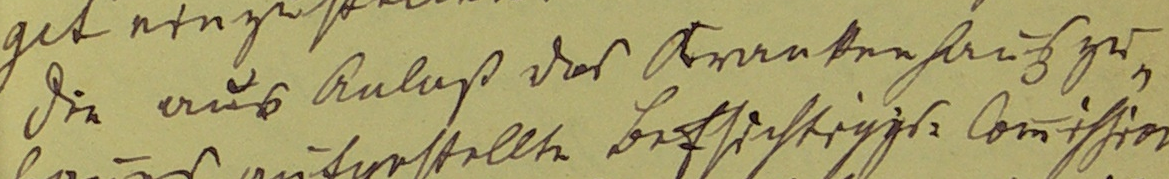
die aus Anlaß das Krankenhaus zu
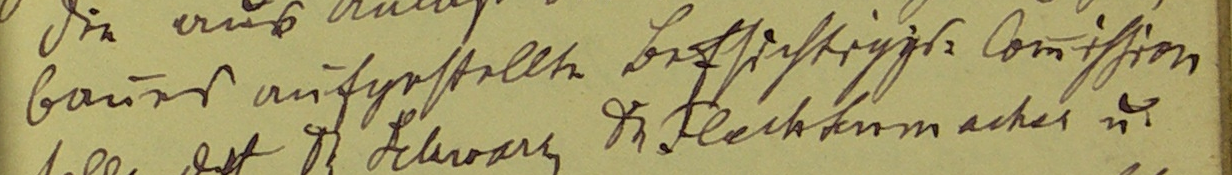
bauen aufgestellte Besichtigungs Commission
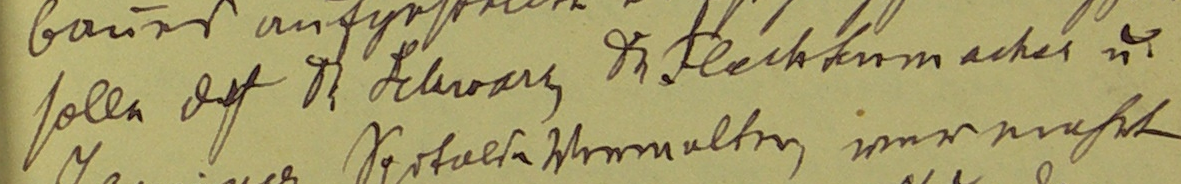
solle durch Dr. Schwarz, Dr. Flechtenmacher und
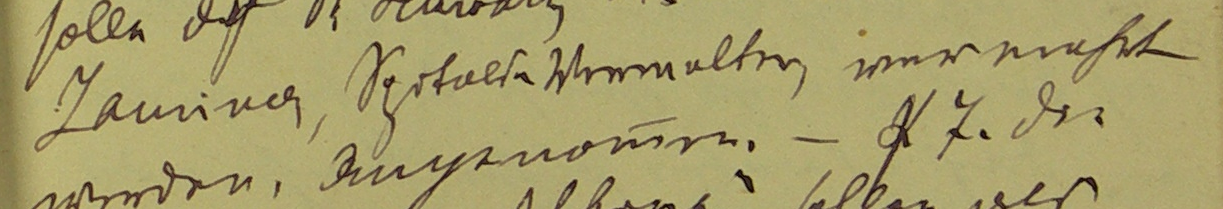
Tamine, Spitals- Verwalter verwahrt
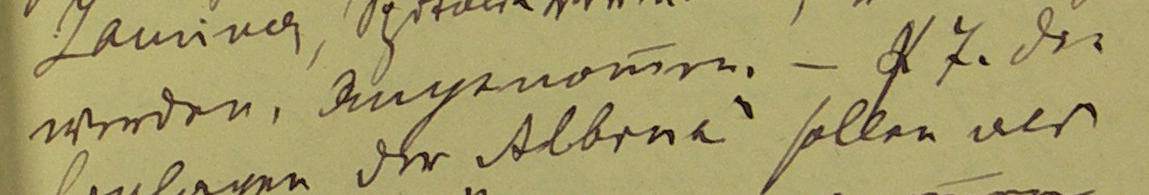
werden, angenommen.- P. 7. Die
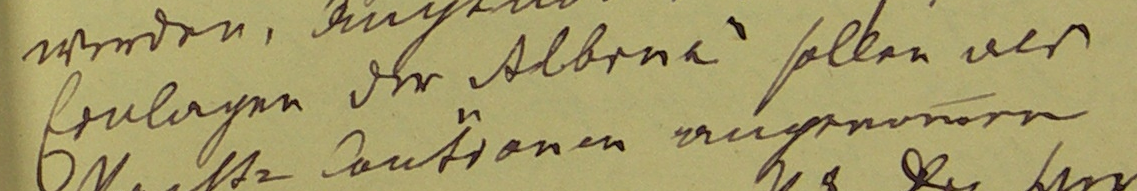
Einlage der Albena sollen als
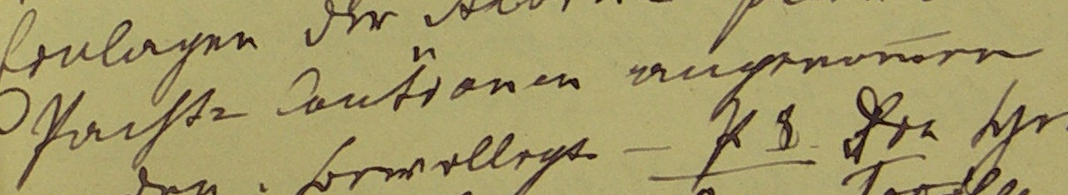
Pacht Cautionen angenommen
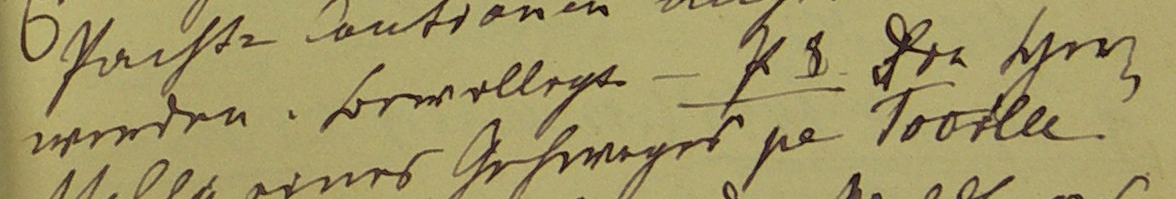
werden, bewilligt- P. 8. Die Her¬
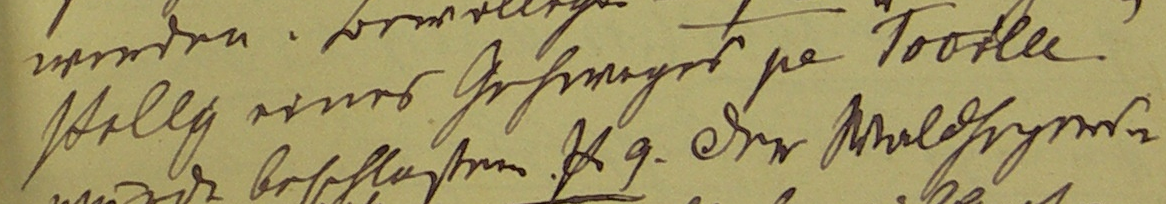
stellung eines Gehweges pe Tocille
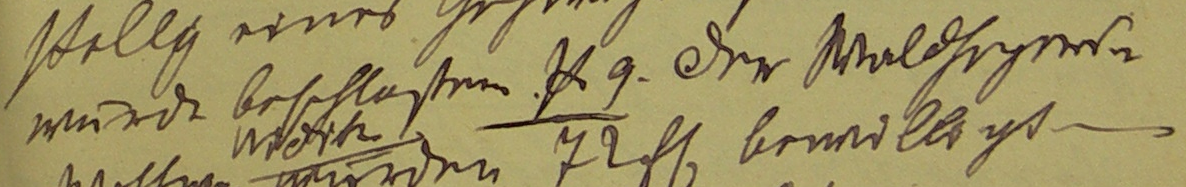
wurde beschlossen.- P 9: Der Waldhegers
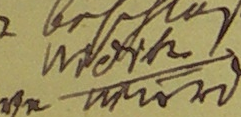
Widick
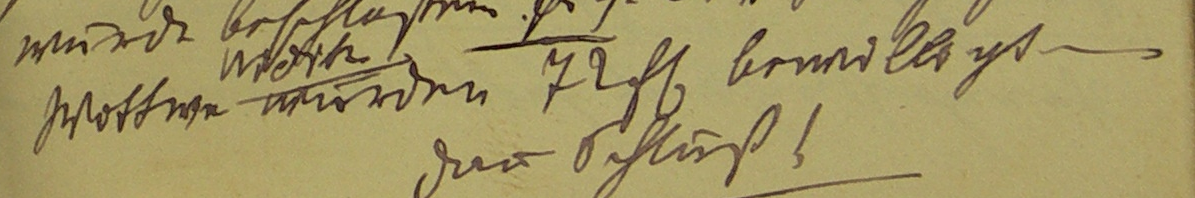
Wottra wurden 72. F.l bewilligt.-
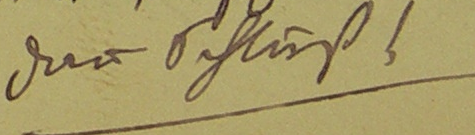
Dann Schluß !
